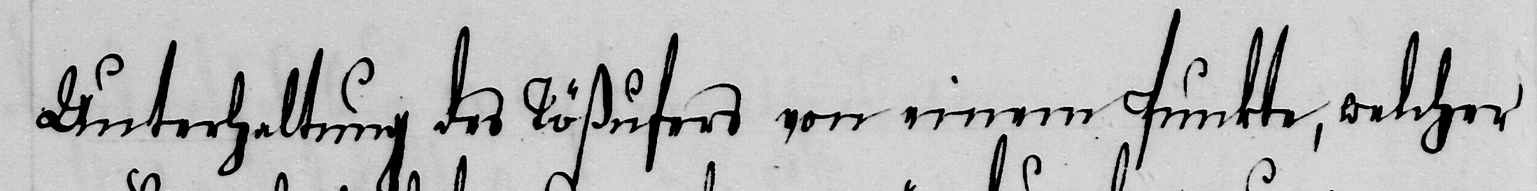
Unterhaltung des Tößufers von einem Punkte, welcher
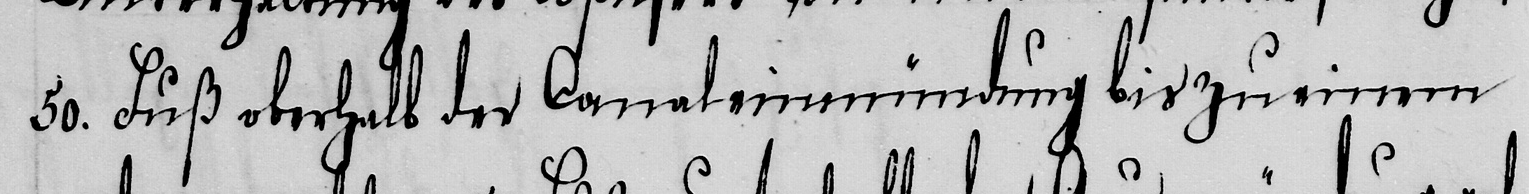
50. Fuß oberhalb der Canaleinmündung bis zu einem
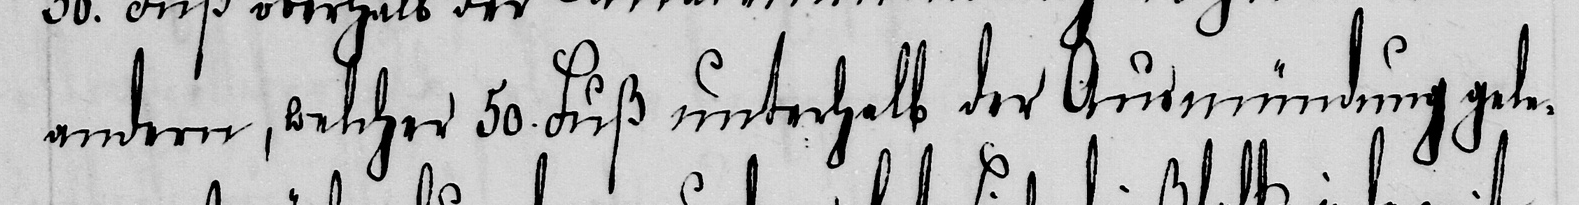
andern, welcher 50. Fuß unterhalb der Ausmündung gele¬
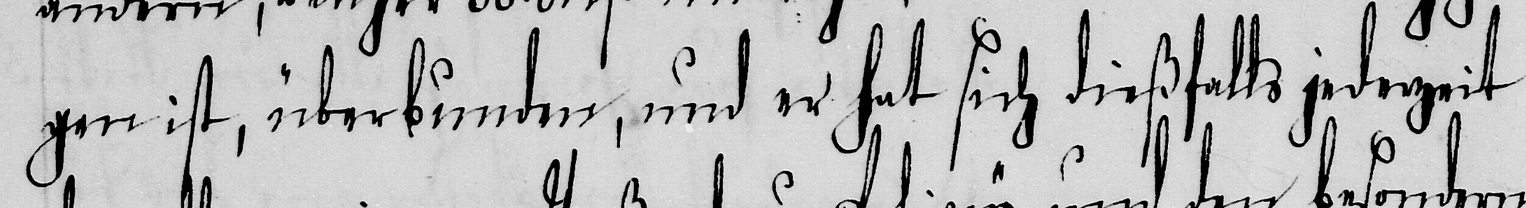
gen ist, überbunden, und er hat sich dießfalls jeder¬
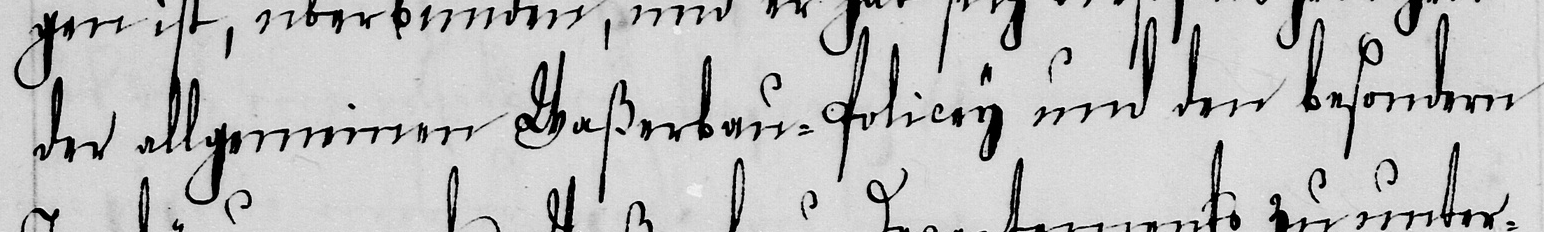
der allgemeinen Waßerbau-Policey und den besondern
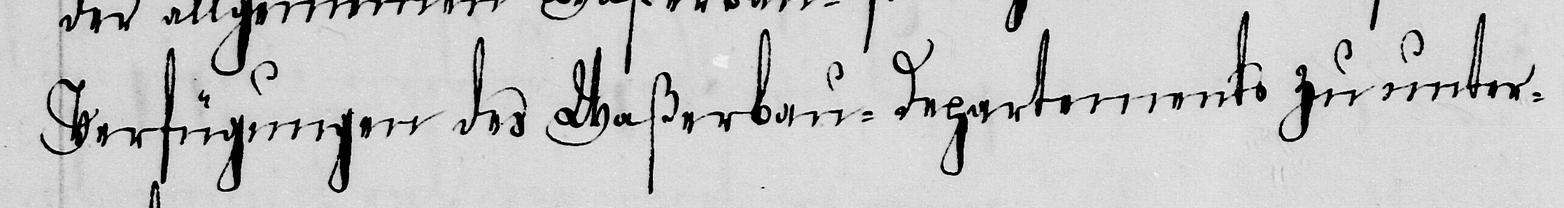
Verfügungen des Waßerbau-Departements zu unter¬
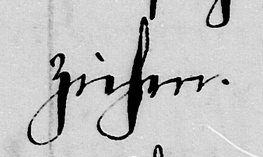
ziehen.
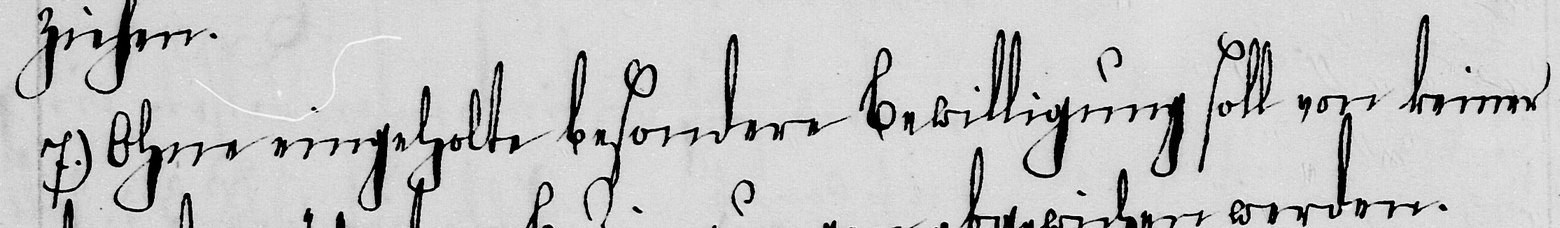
7.) Ohne eingeholte besondere Bewilligung soll von keiner
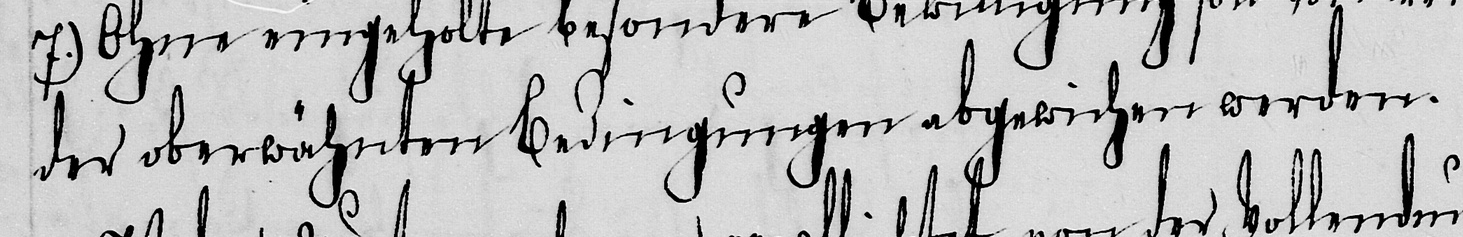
der oberwähnten Bedingungen abgewichen werden.
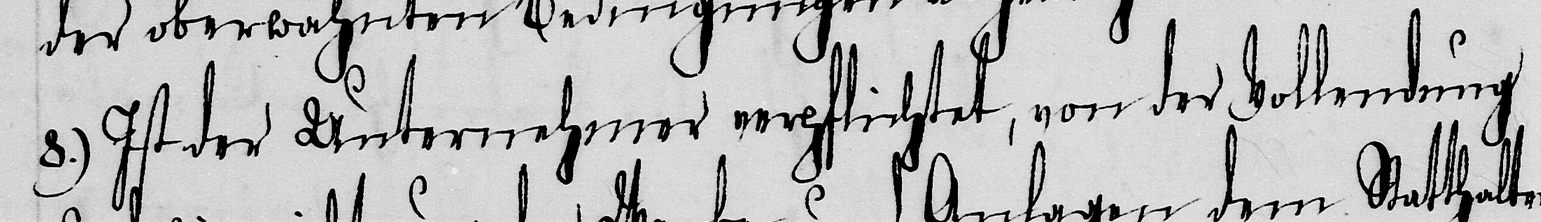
8.) Ist der Unternehmer verpflichtet, von der Vollendung
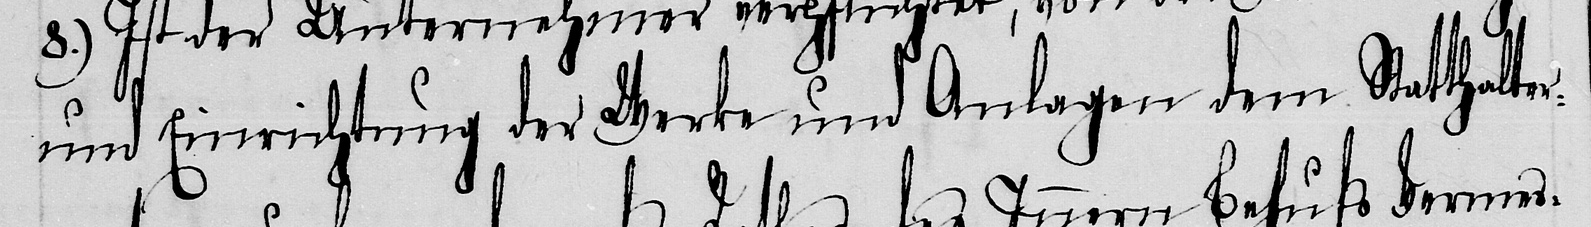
und Einrichtung der Werke und Anlagen dem Statthal¬
